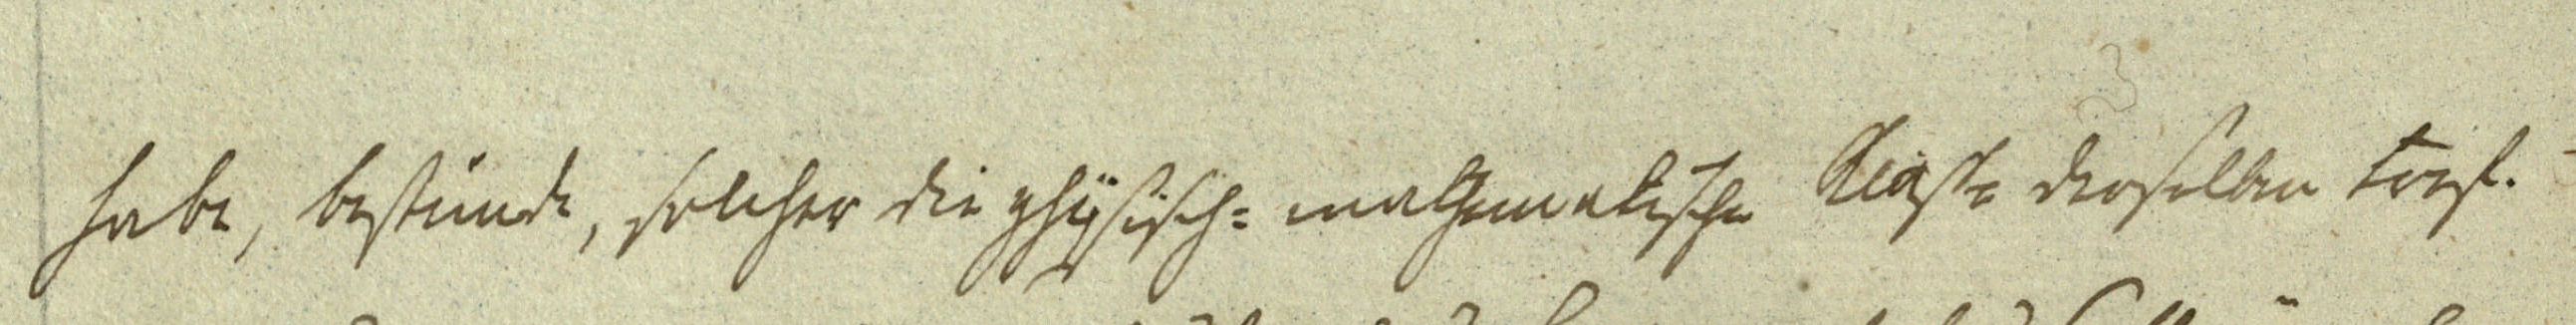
habe, bestünde, solcher die phÿsisch-mathematische Klasse derselben tref¬
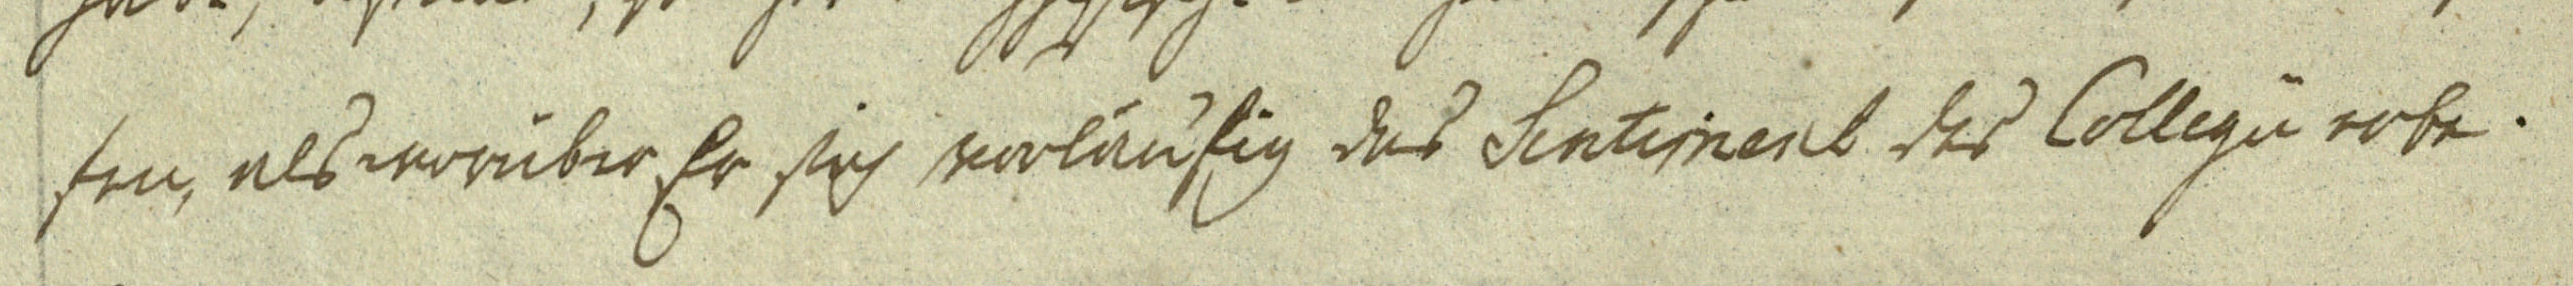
fen, als worüber Er sich vorläufig das Sentiment des Collegio erbe¬
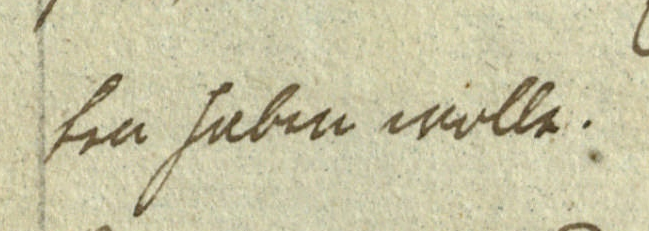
ten haben wolle.
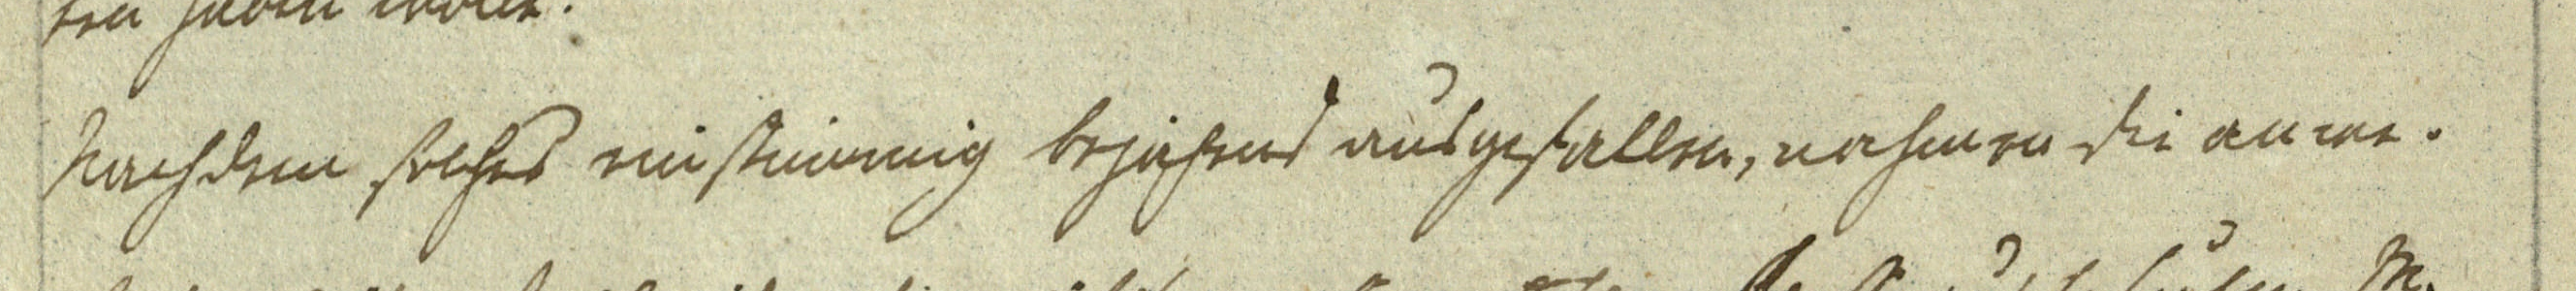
Nachdem solches einstimmig bejahend ausgefallen, nahmen die anwe¬
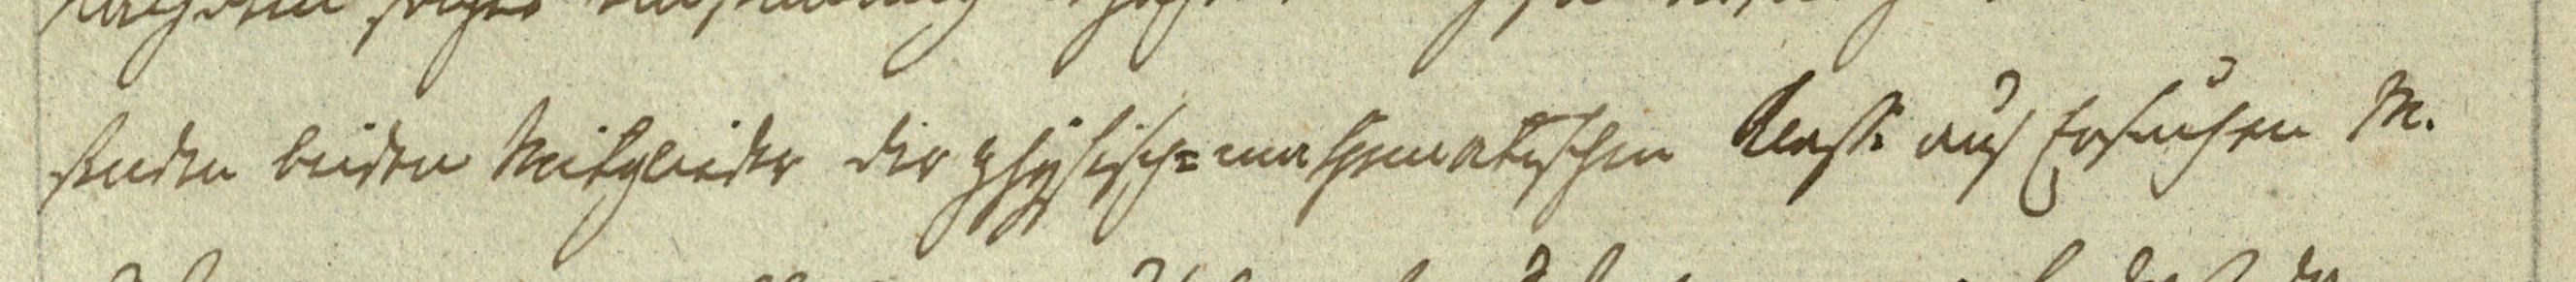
senden beiden Mitglieder der phÿsisch-mathematischen Klasse auf Ersuchen M.
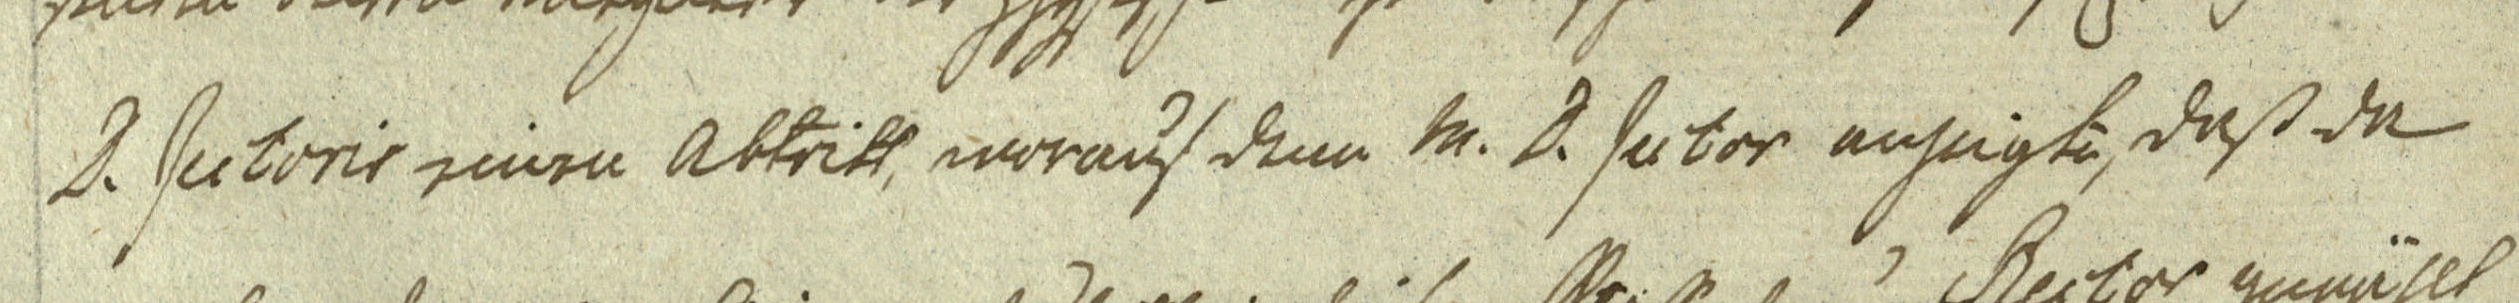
D. Rectoris einen Abtritt, worauf denn M. D. Rector anzeigte, daß da
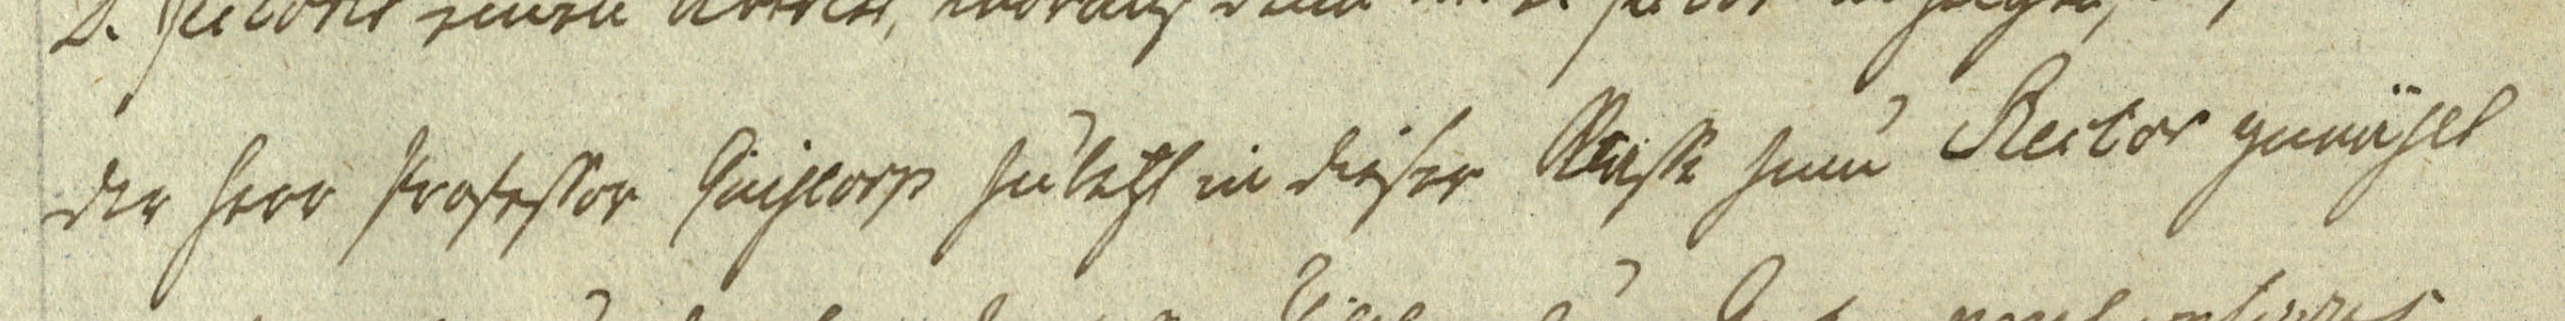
der Herr Professor Quistorp zuletzt in dieser Klasse zum Rector gewählt
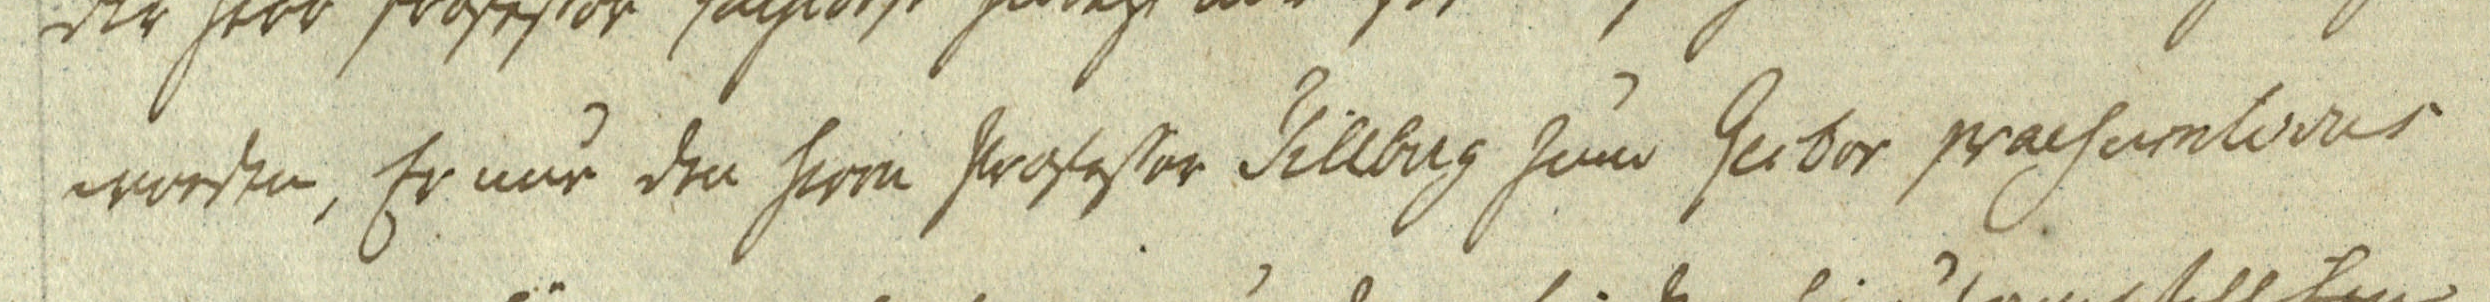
worden, Er nur den Herrn Professor Tillberg zum Rector paeseumtivus
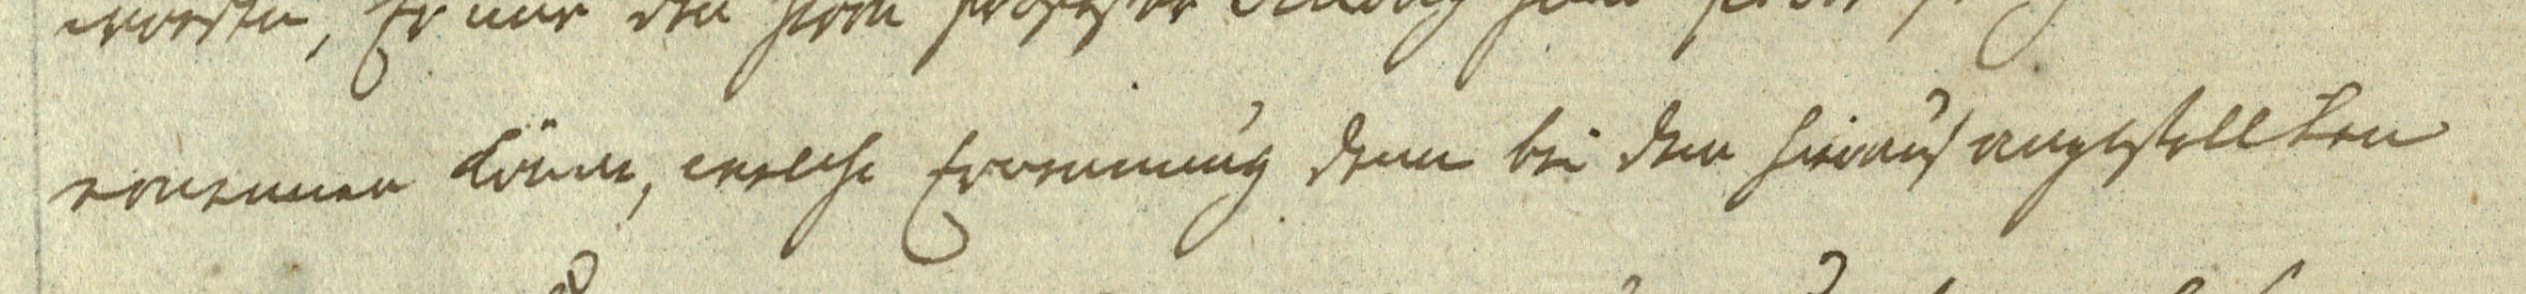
ernennen könne, welche Ernennung dem bei dem hierauf angestellten
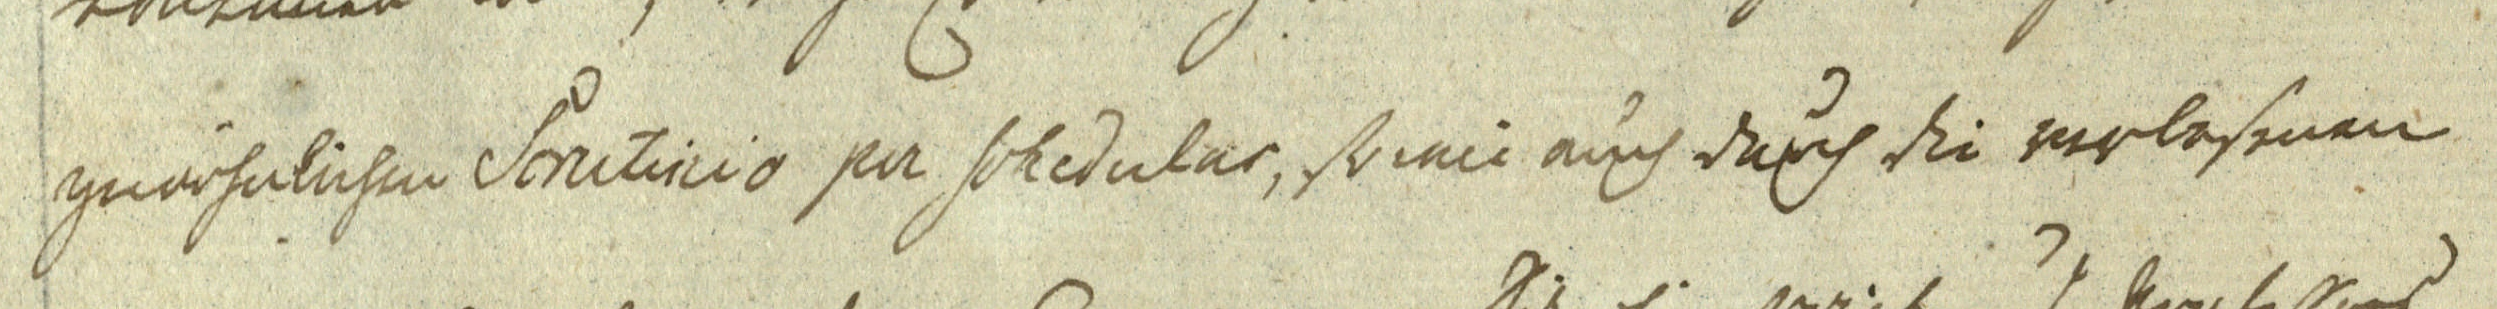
gewöhnlichen Scrutinio per schedulas, so wie auch durch die verlesenen
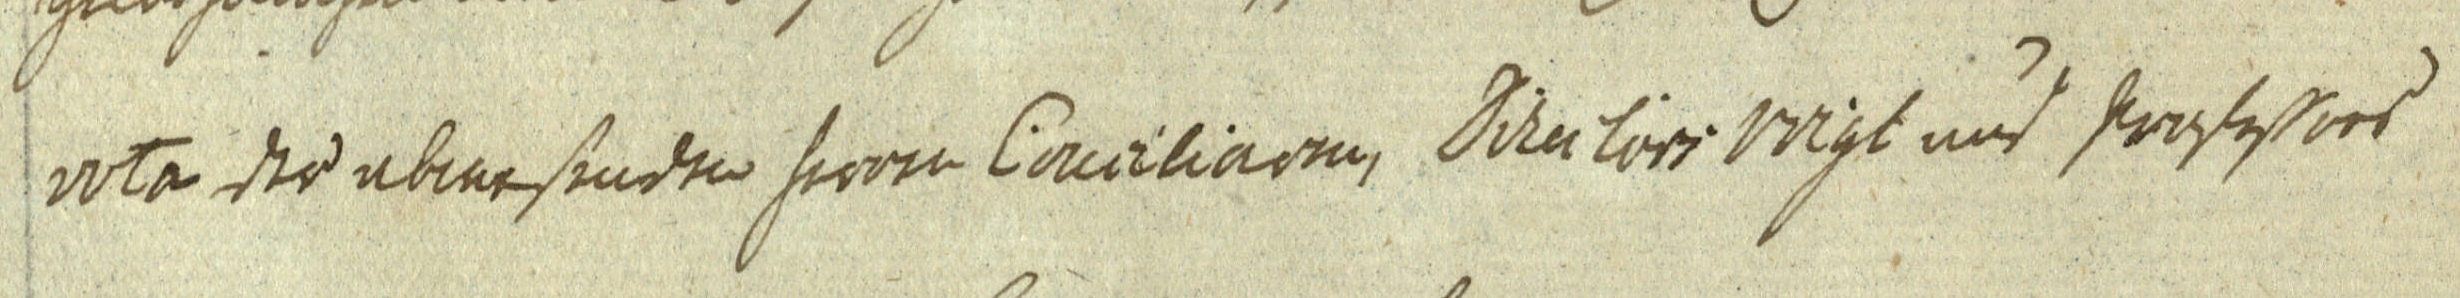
vota der abwesenden Herrn Conciliaren, Directors Voigt und Professors
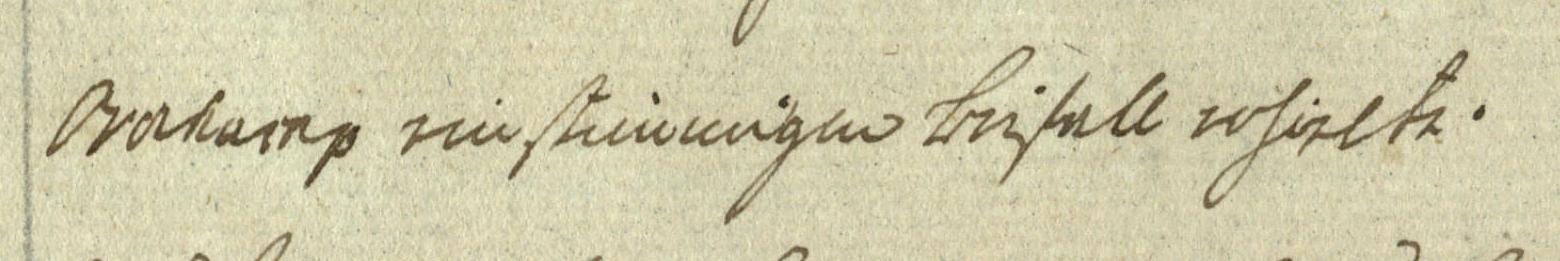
Overkamp einstimmigen Beifall erhielte.
